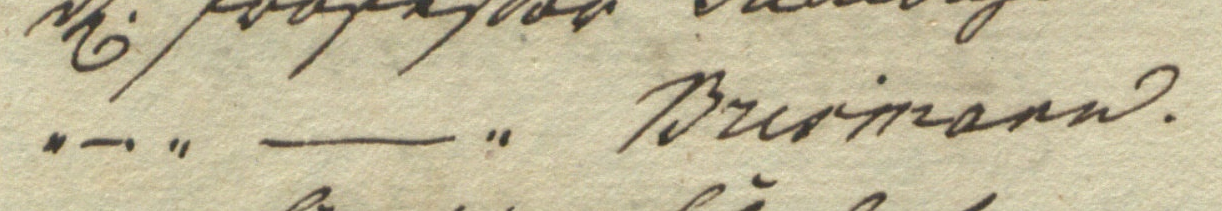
Brismann.
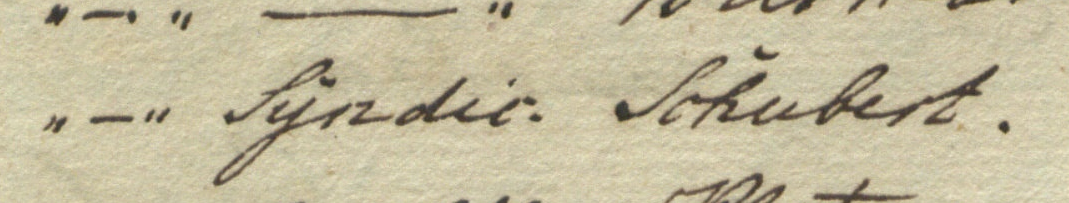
Sÿndic. Schubert
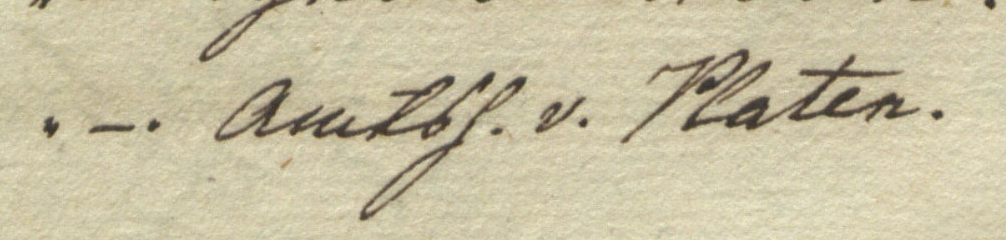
Amtsh. v. Platen.
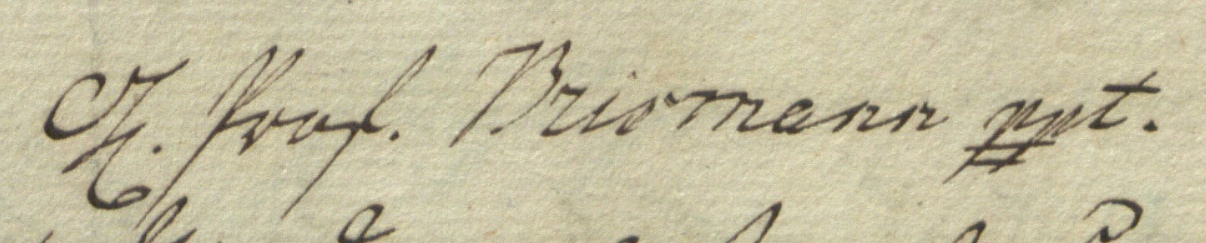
dh. Prof. Brismann ppt.
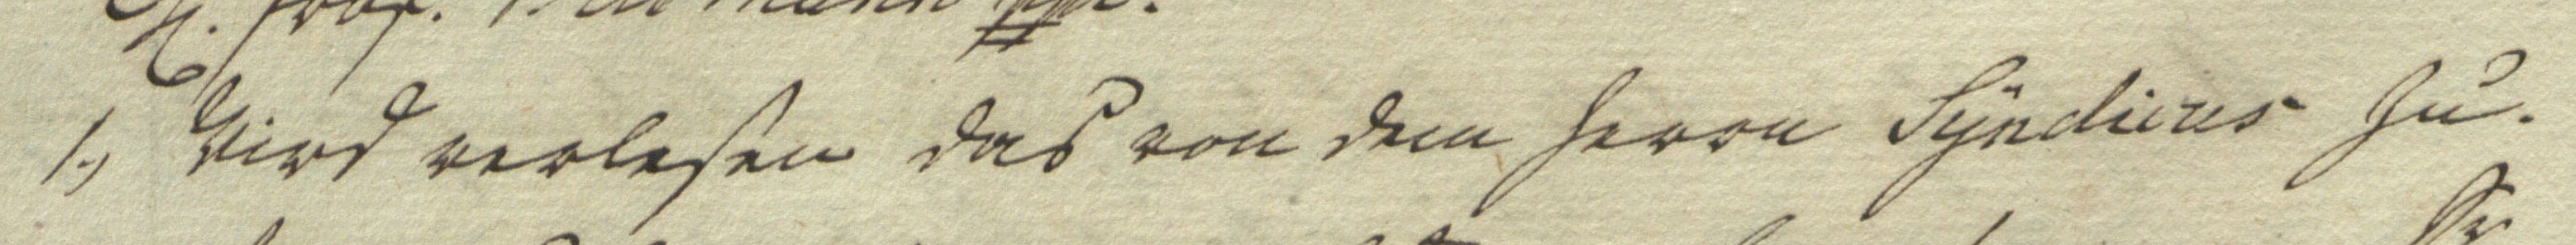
1., Wird verlesen das von dem Herrn Sÿndicus zu¬
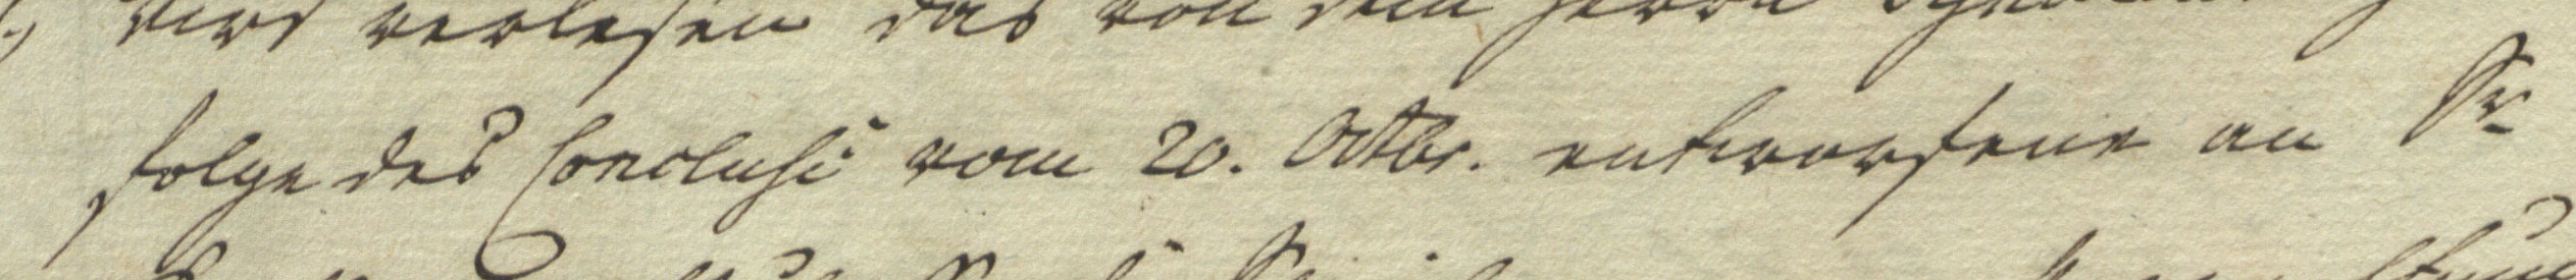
folge des Conclusi vom 20. Octbr. entworfene an Sr
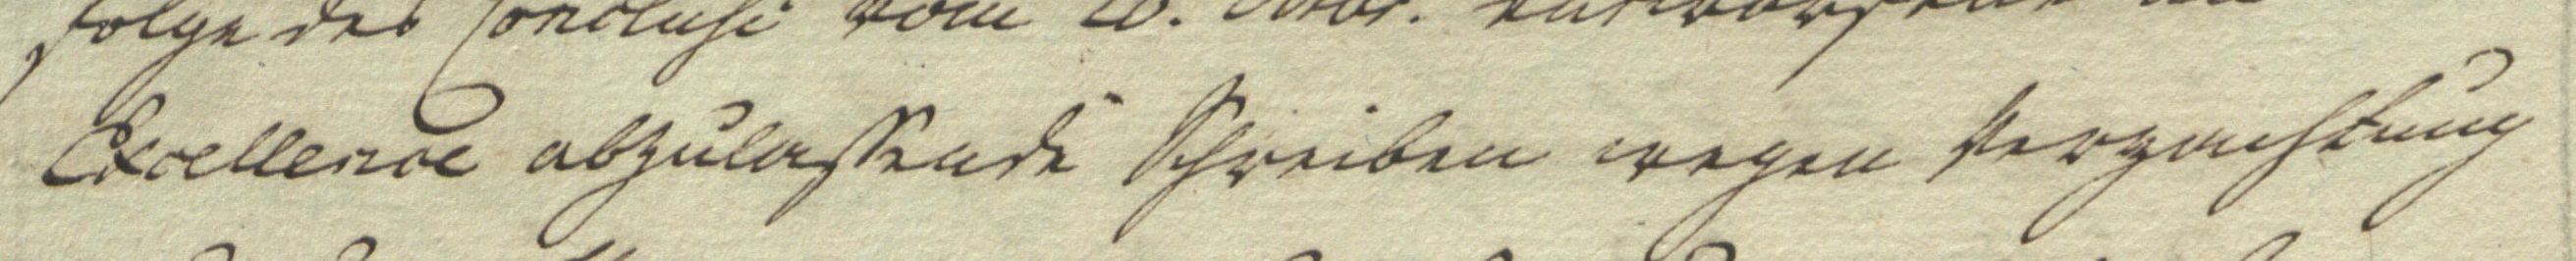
Excellence abzulassende Schreiben wegen Verpachtung
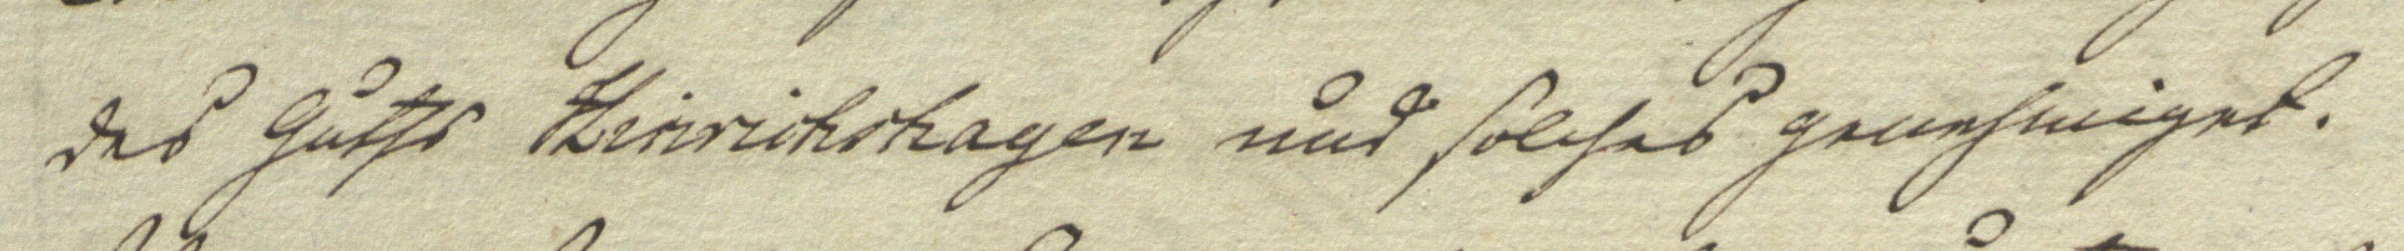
des Guths Hinrichshagen und solches genehmiget.
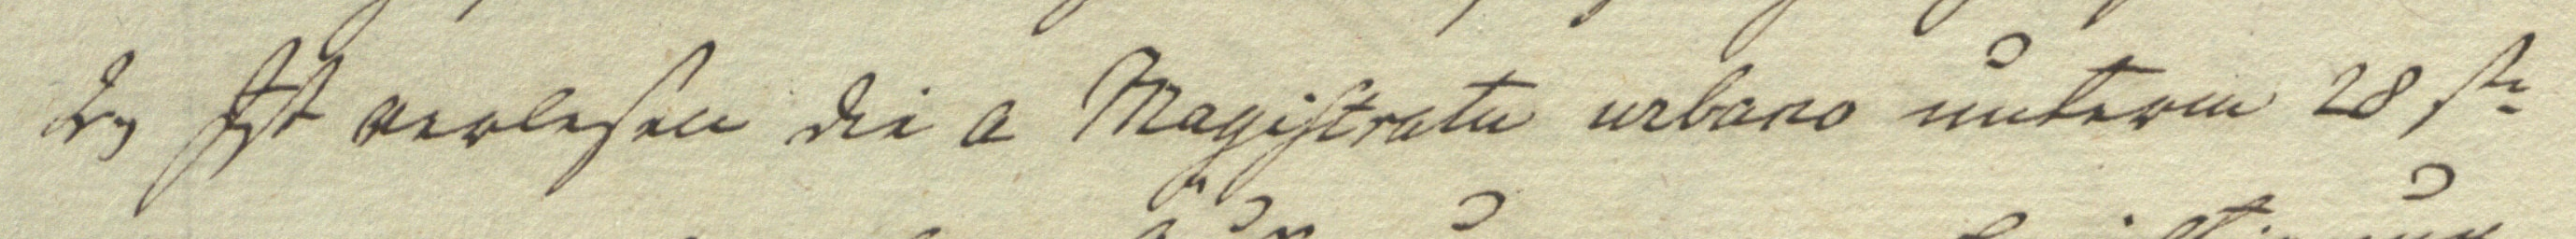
2., Ist verlesen die a Magistratu urbano unterm 28 st.
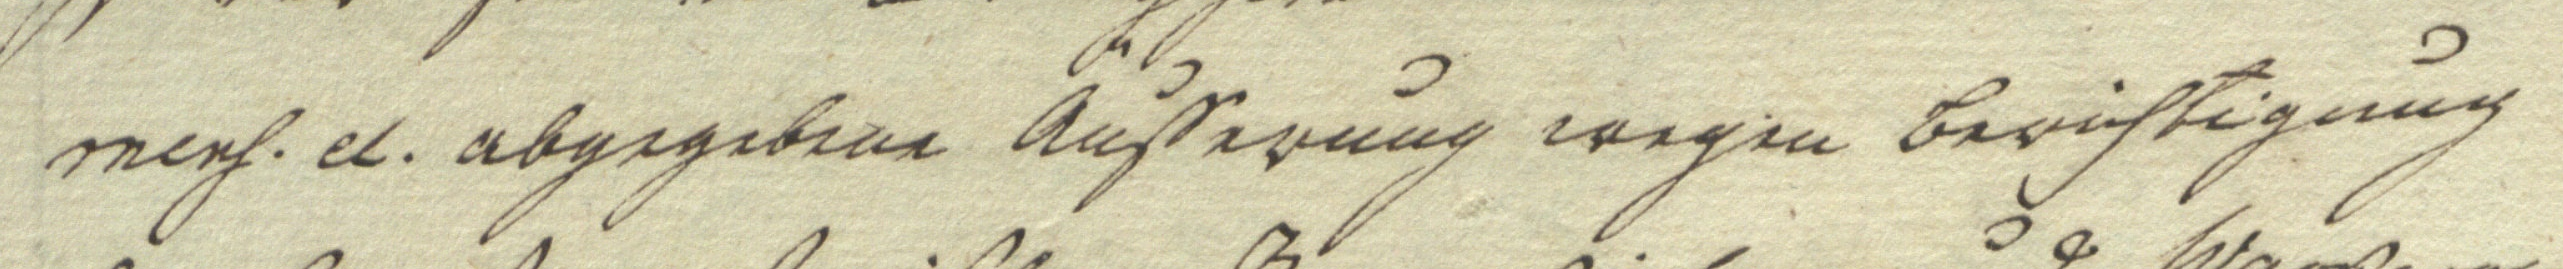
mens. el. abgegebene Äusserung wegen Berichtigung
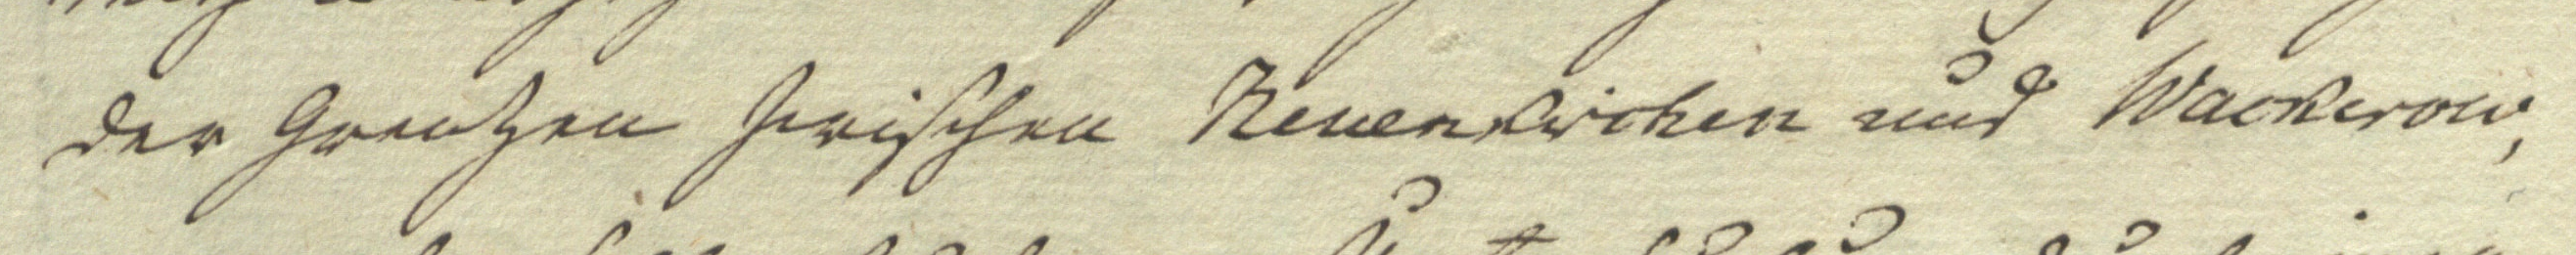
der Grenzen zwischen Neuenkirchen und Wackerow,
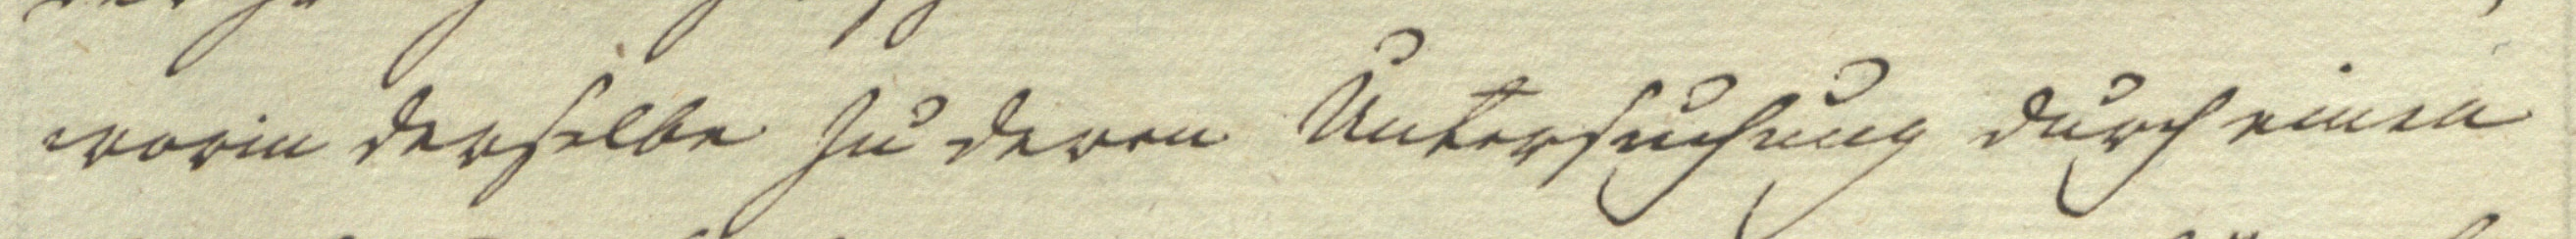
worin derselbe zu deren Untersuchung durch einen
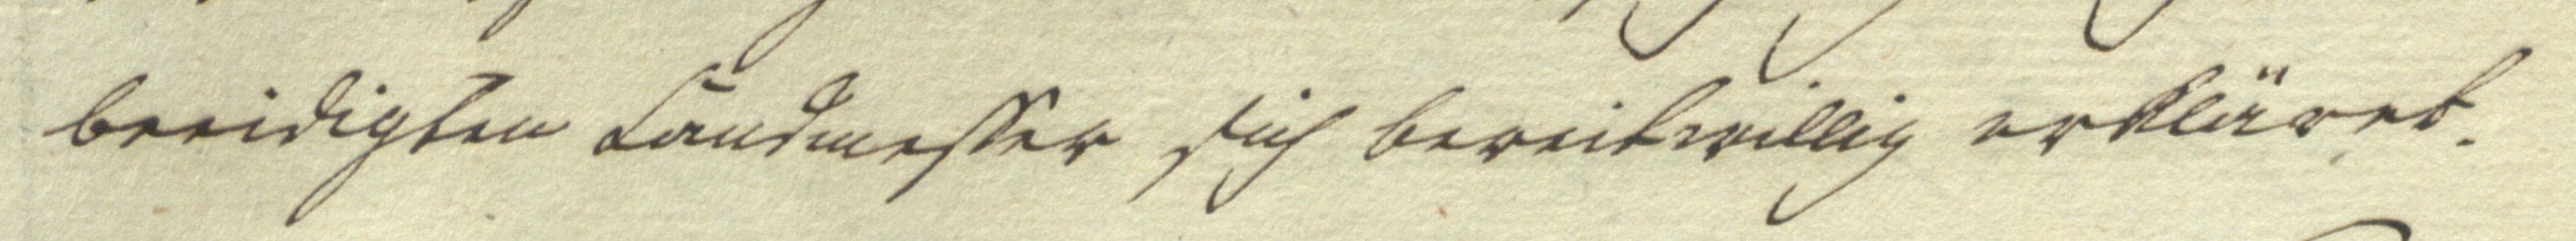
beeidigten Landmesser sich bereitwillig erkläret.
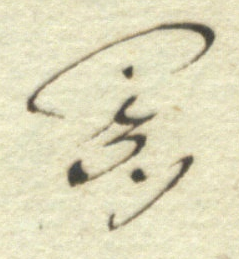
3.,
